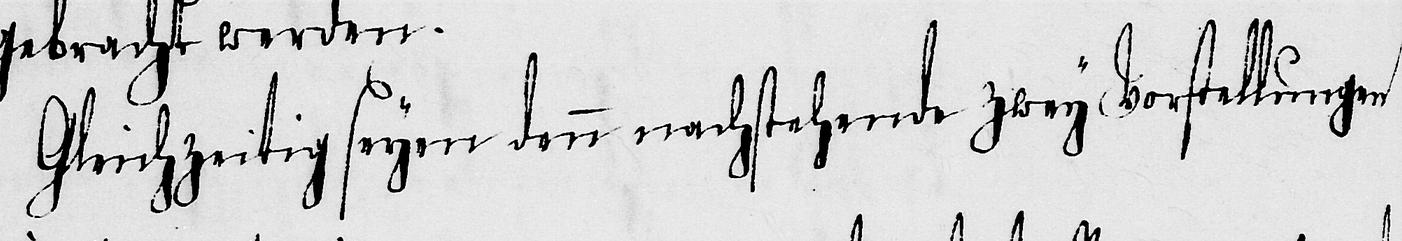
Gleichzeitig seyen denn nachstende zwey Vorstellungen
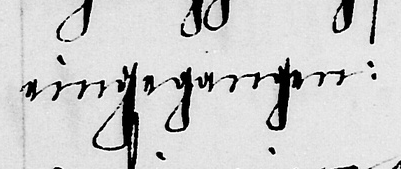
eingegangen:
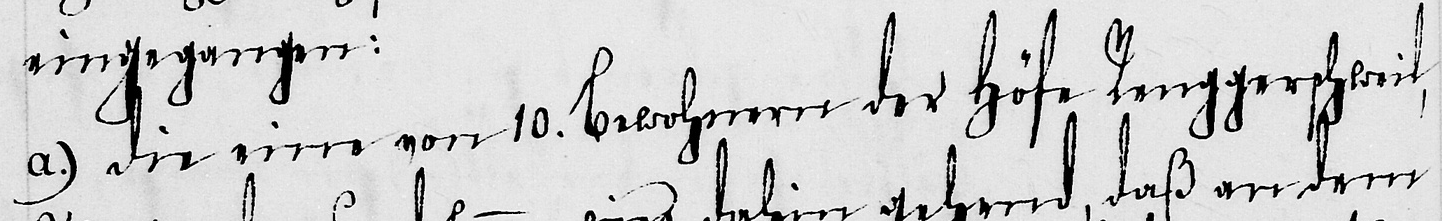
a.) die eine von 10. Bewohnern der Höfe Renggerschweil,
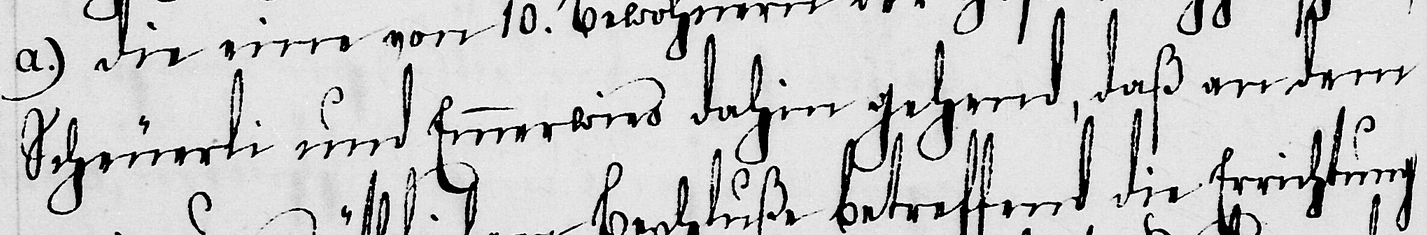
Scheuerli und Emmerwies dahin gehend, daß an dem
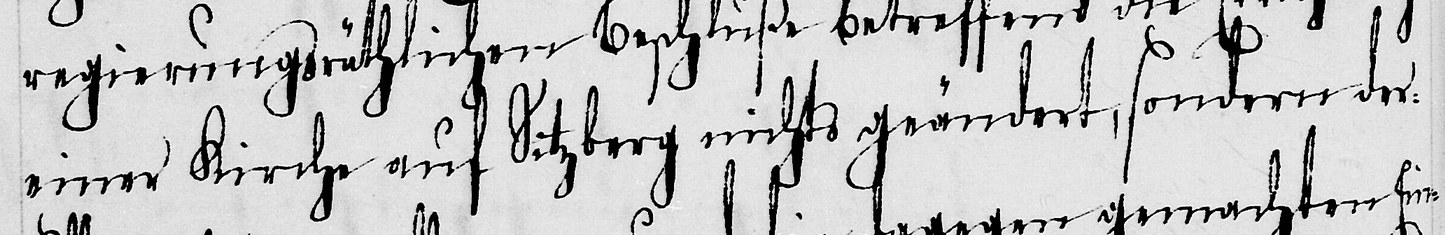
einer Kirche auf Sitzberg nichts geändert, sondern der¬
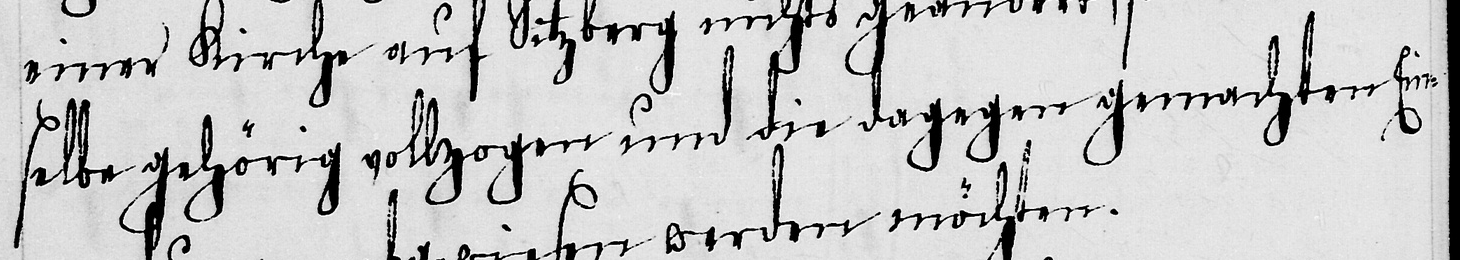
selbe gehörig vollzogen und die dagegen gemachten Ein¬
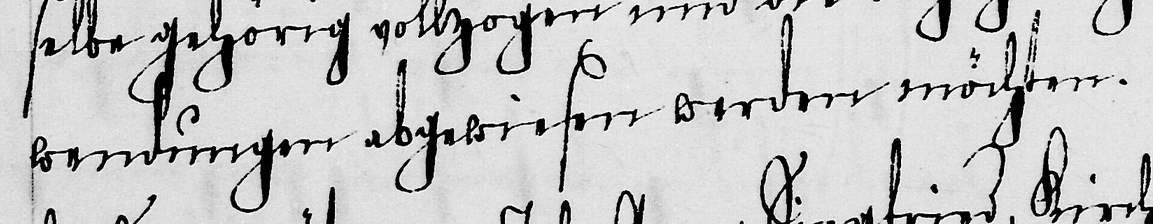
wendungen abgewiesen werden möchten.
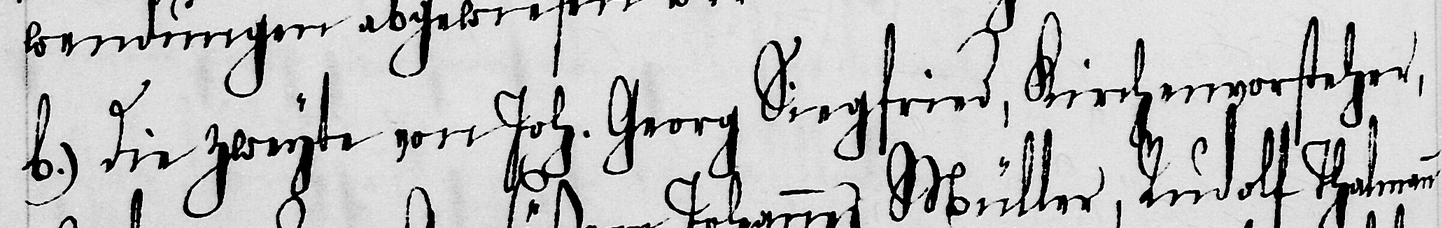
b.) Die zweyte von Joh. Georg Siegfried, Kirchenvorsteher,
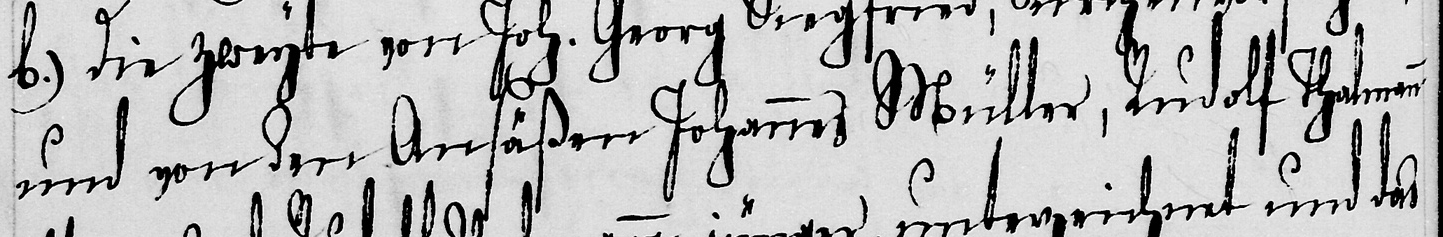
und von den Ansäßen Johannes Müller, Rudolf Thalma¬
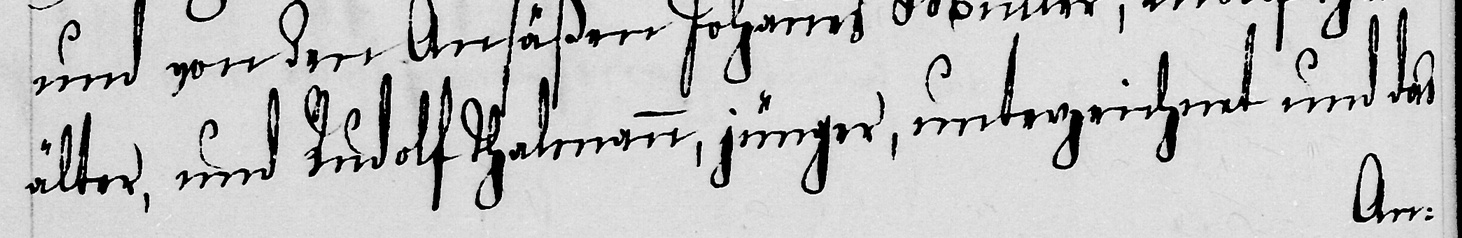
älter, und Rudolf Thalmann, jünger, unterzeichnet und das
